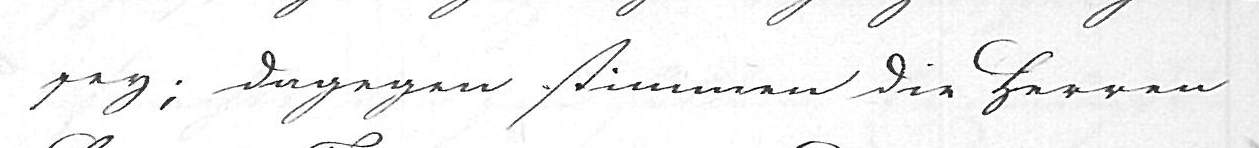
sey; dagegen stimmen die Herren
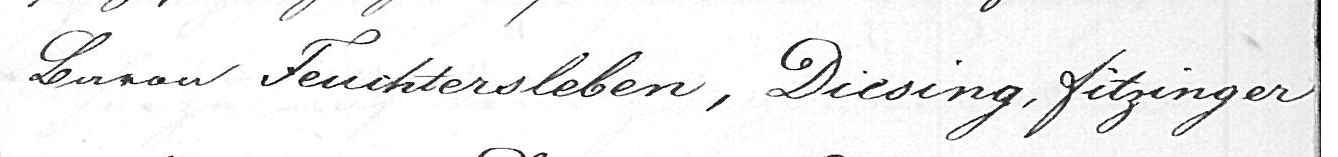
Baron Feuchtersleben, Diesing, Fitzinger
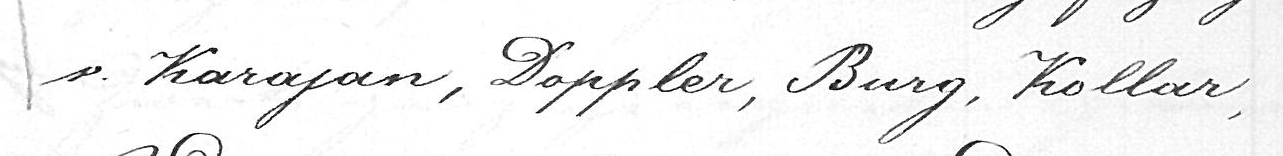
v. Karajan, Doppler, Burg, Kollar,
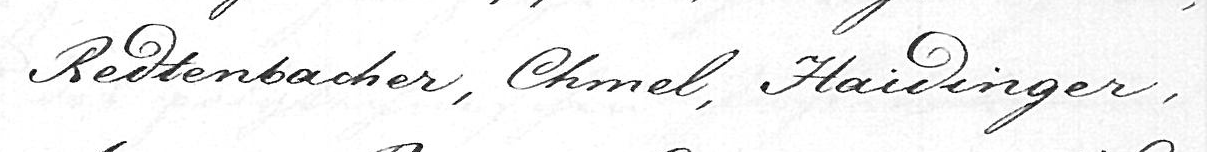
Redtenbacher, Chmel, Haidinger,
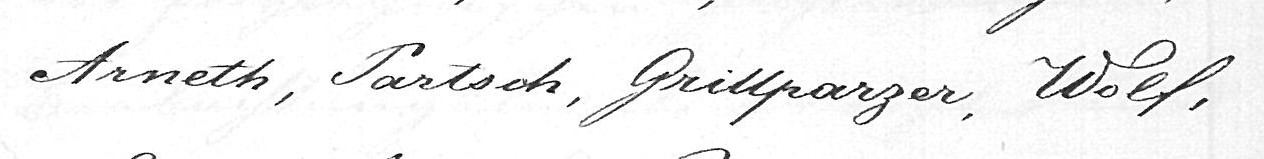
Arneth, Partsch, Grillparzer, Wolf,
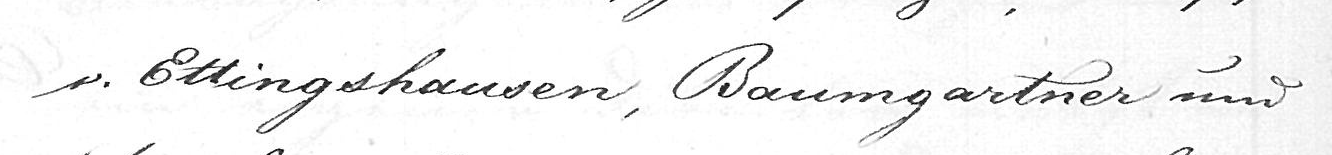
v. Ettingshausen, Baumgartner und
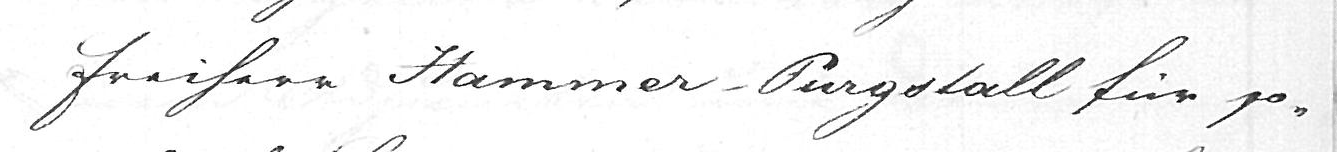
Freiherr Hammer-Purgstall für so-
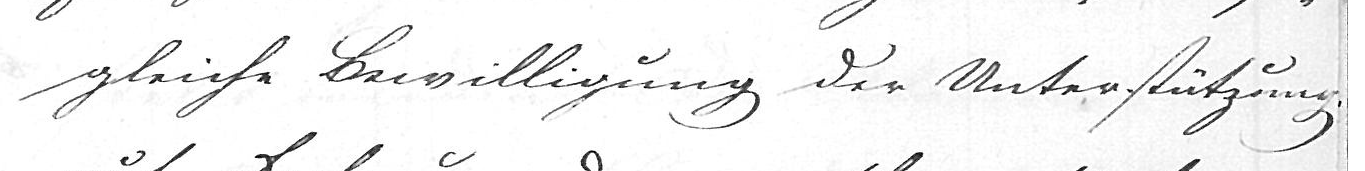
gleiche Bewilligung der Unterstützung
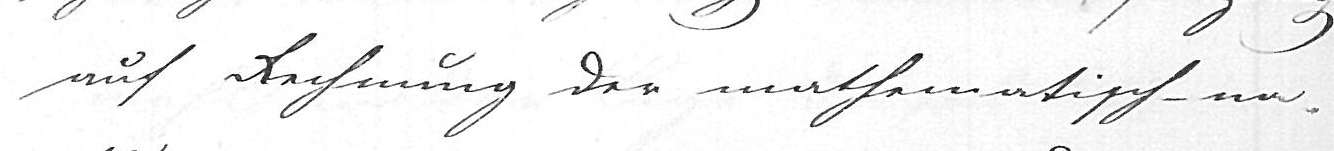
auf Rechnung der mathematisch-na-
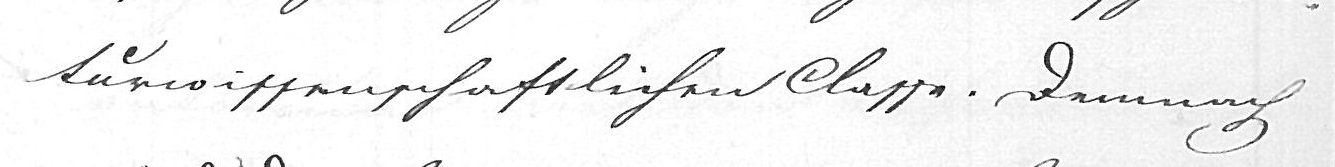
turwissenschaftlichen Classe. Demnach
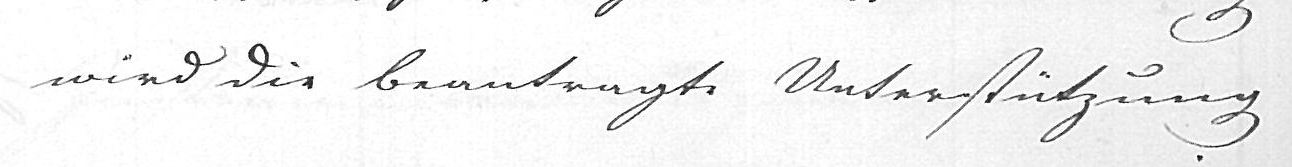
wird die beantragte Unterstützung
